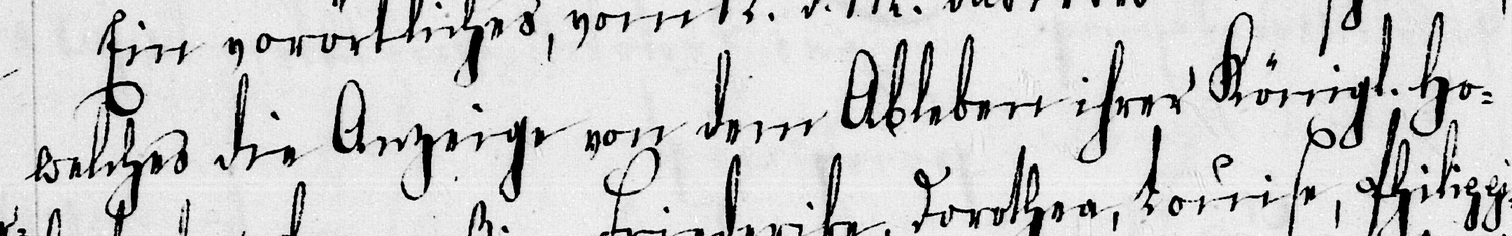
welches die Anzeige von dem Ableben ihrer Königl. Ho¬
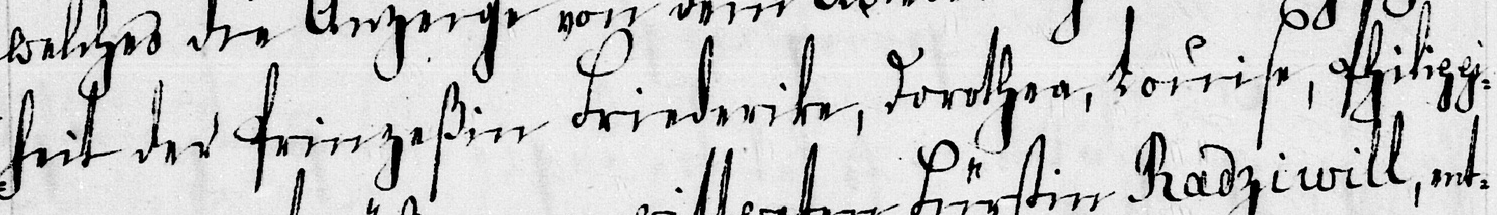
heit der Prinzeßin Friederike, Dorothea, Louise, Philip¬
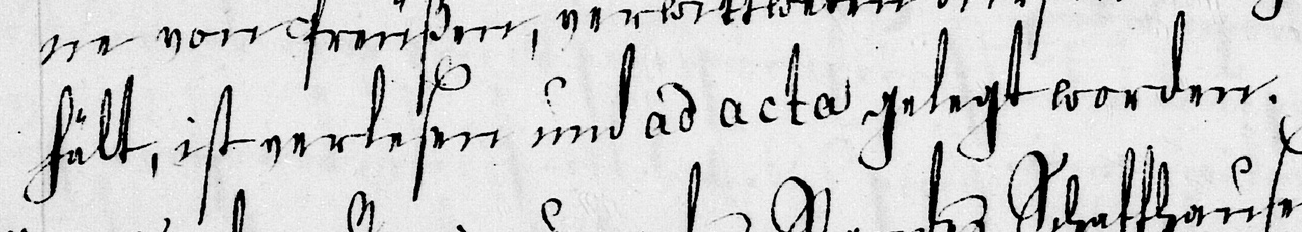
hält, ist verlesen und ad acta gelegt worden.
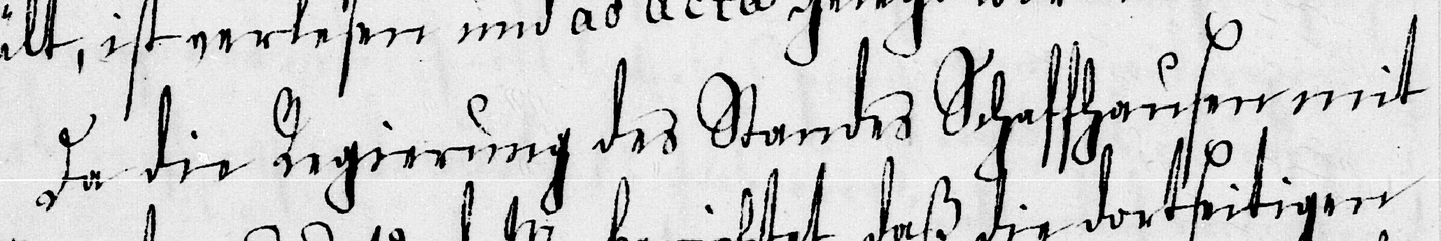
Da die Regierung des Standes Schaffhausen mit
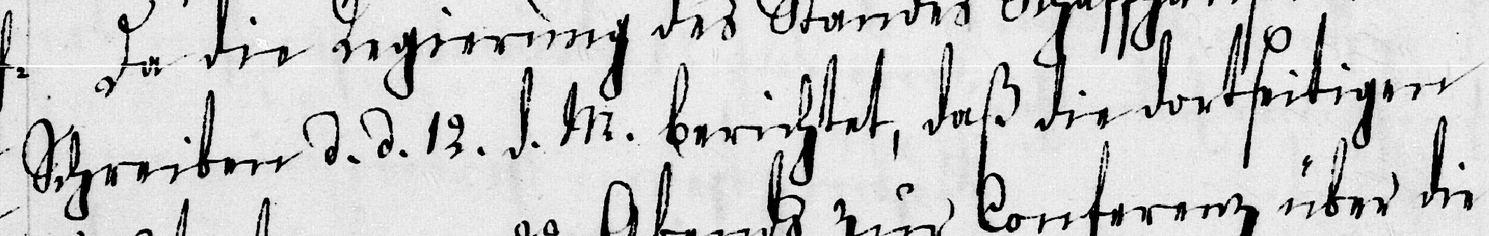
Schreiben d. d. 12. d. M. berichtet, daß die dortseitigen
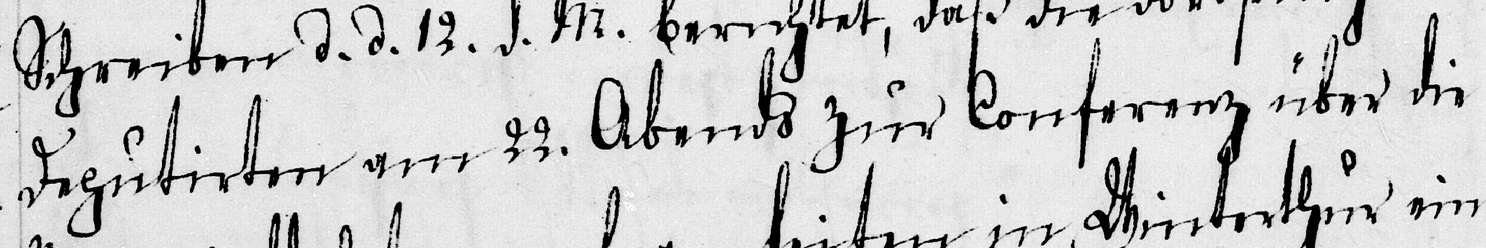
Deputirten am 22. Abends zur Conferenz über die
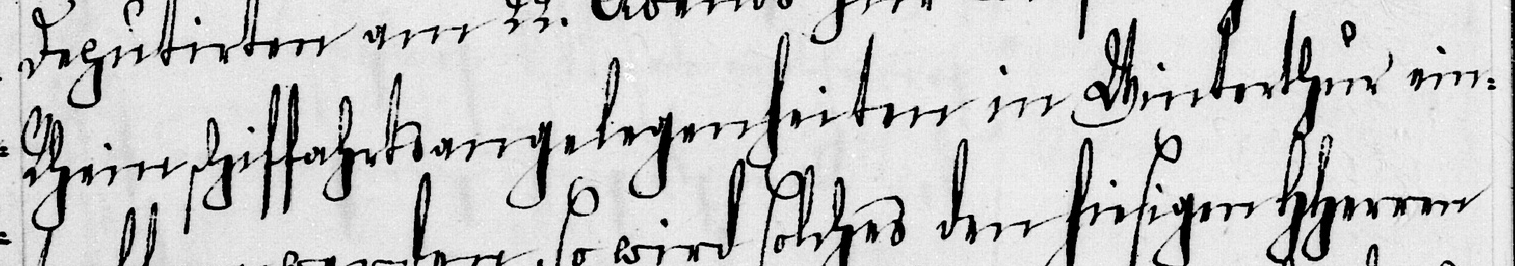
Rheinschiffahrtsangelegenheiten in Winterthur ein¬
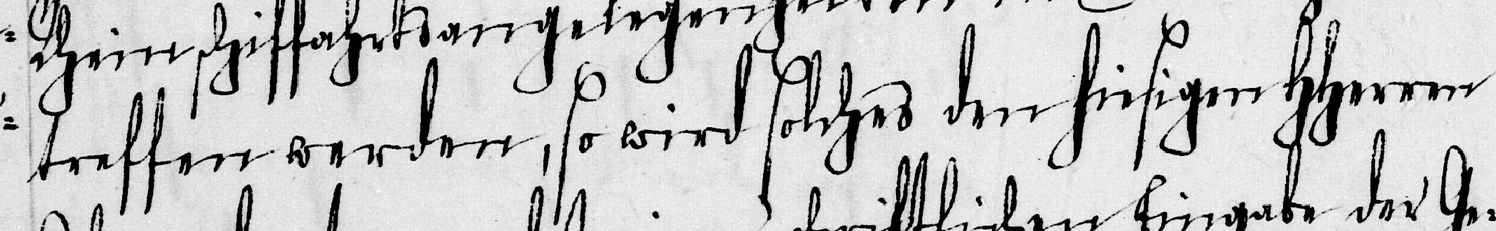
treffen werden, so wird solches den hiesigen HHer¬
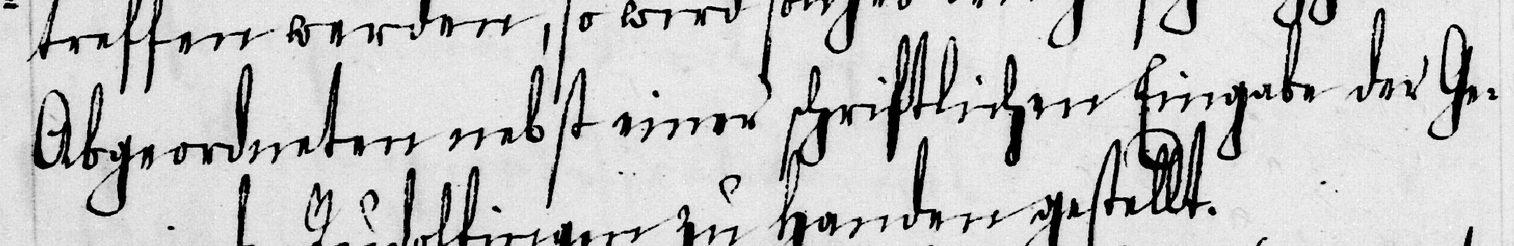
Abgeordneten nebst einer schriftlichen Eingabe der Ge¬
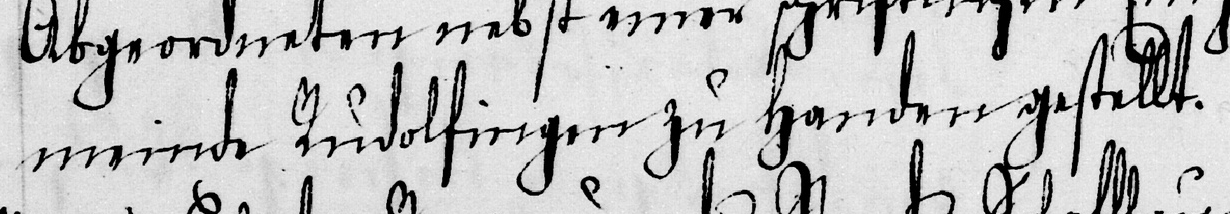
meinde Rudolfingen zu Handen gestellt.
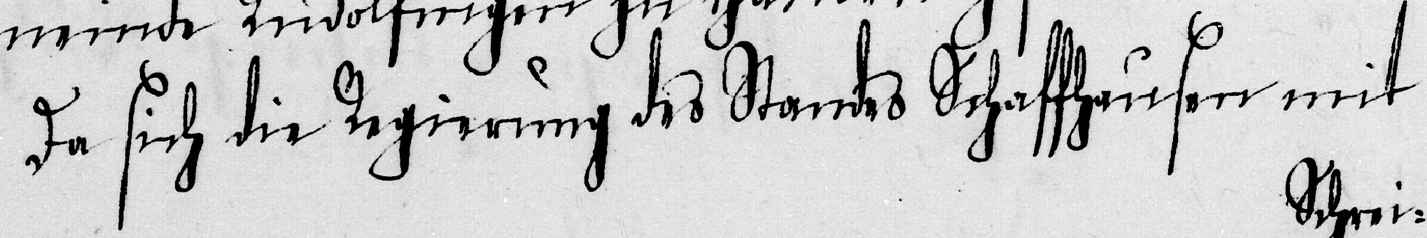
Da sich die Regierung des Standes Schaffhausen mit
